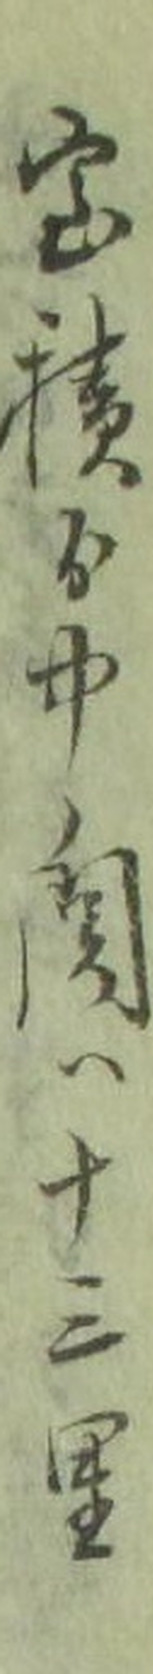室積ゟ中ノ関へ十三里
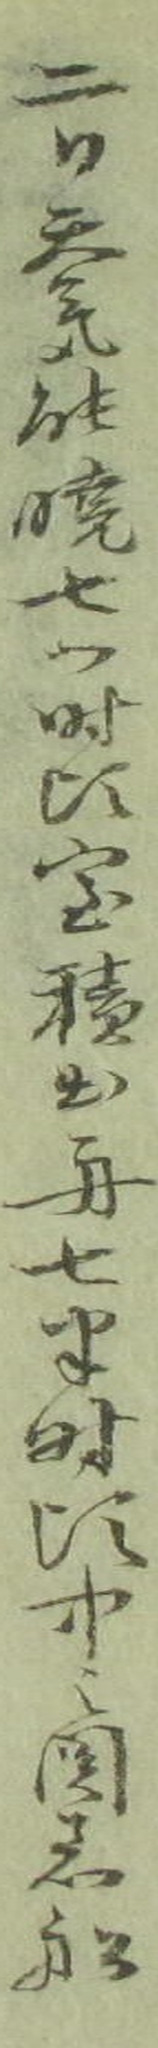二日天気能暁七ツ時頃室積出舟七半時頃中之関着船
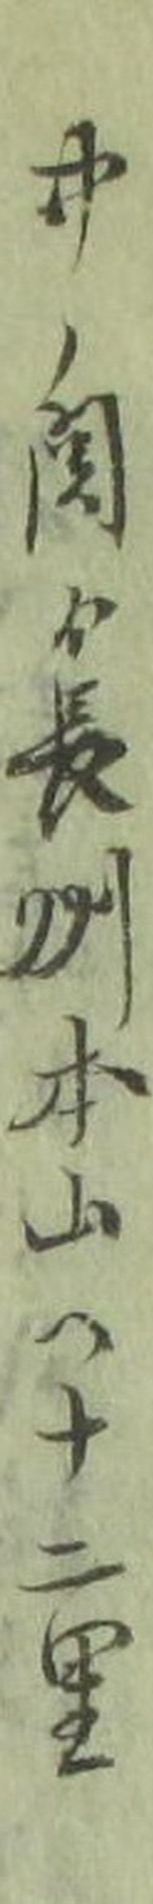中ノ関ゟ長州本山へ十二里
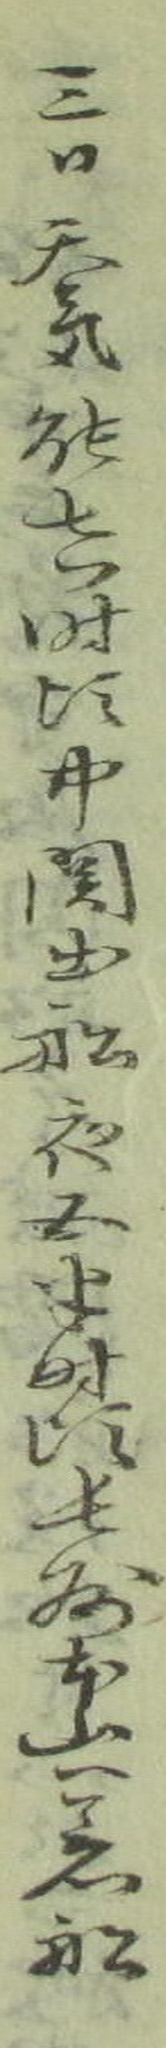三日天気能七ツ時頃中関出船夜五半時頃長州本山へ着船
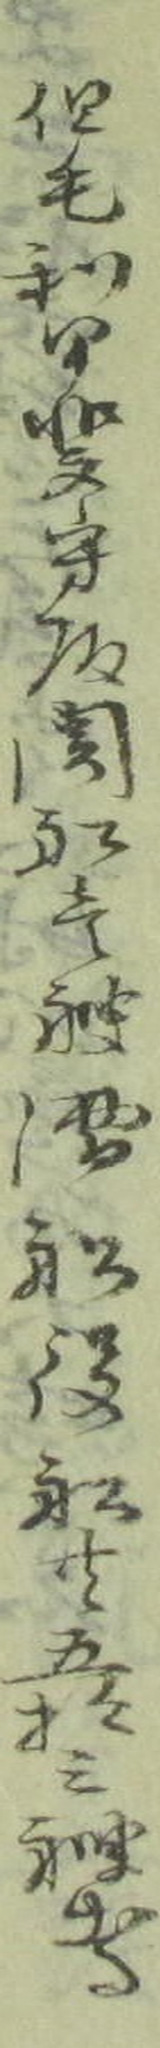但毛利甲斐守殿関船壱艘漕船役船共五拾三艘出る
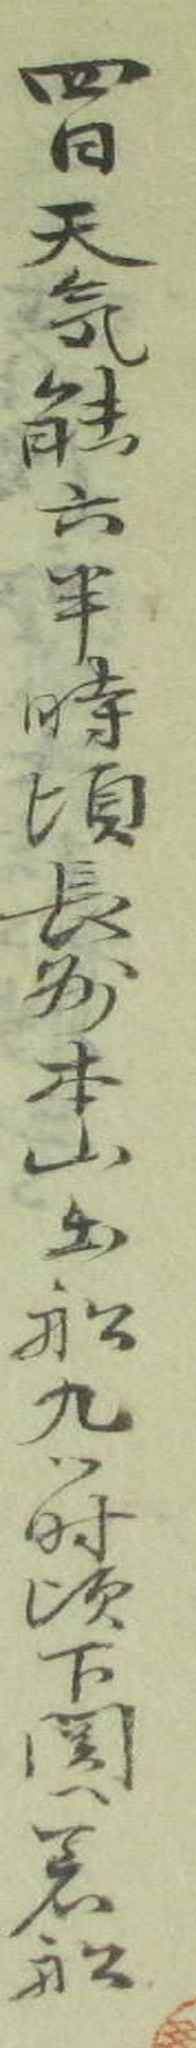四日天気能六半時頃長州本山出船九ツ時頃下関へ着船
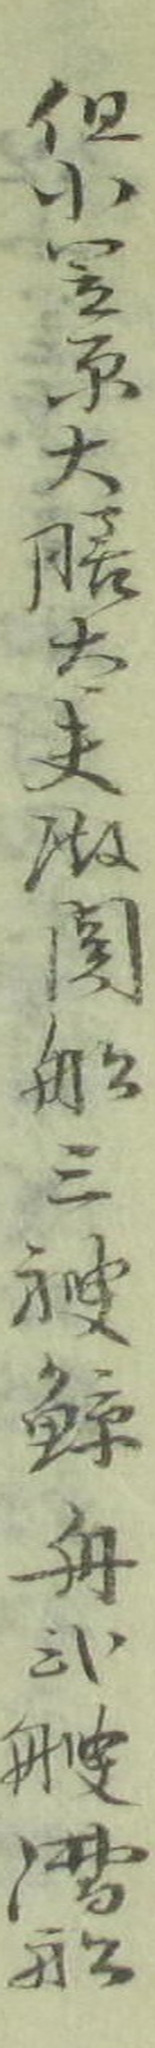但小笠原大膳太夫殿関船三艘鯨舟弐艘漕船
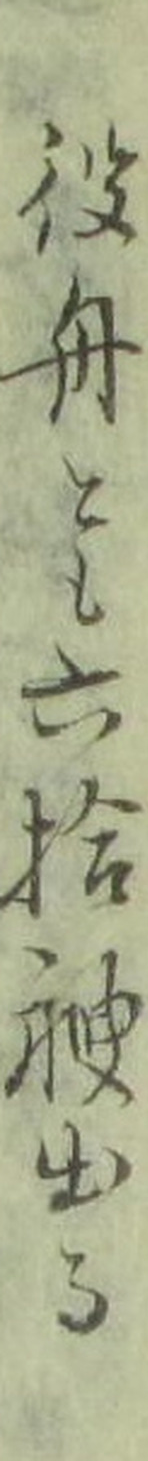役舟とも六拾艘出る
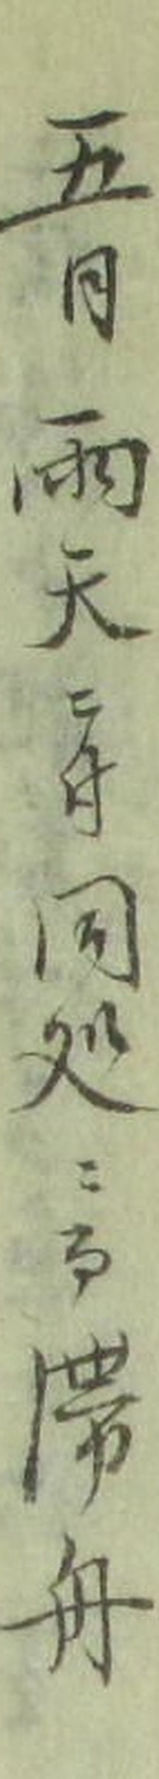五日雨天に付同処に而滞舟
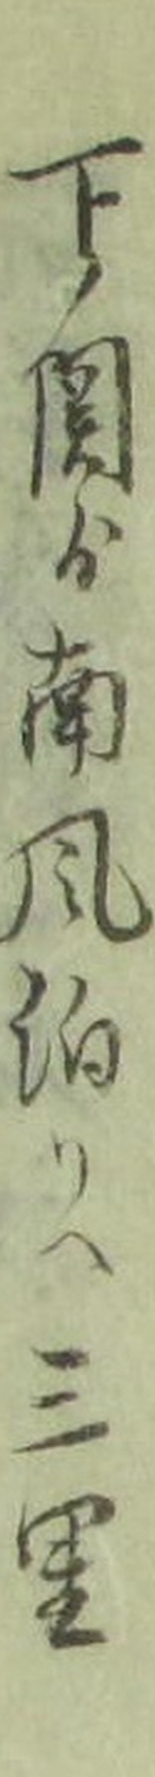下ノ関ゟ南風泊りへ三里
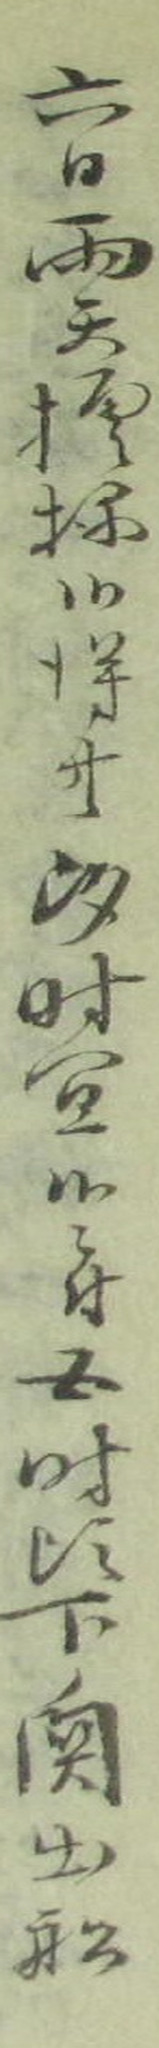六日雨天模様候得共汐時宜候に付五時頃下ノ関出船
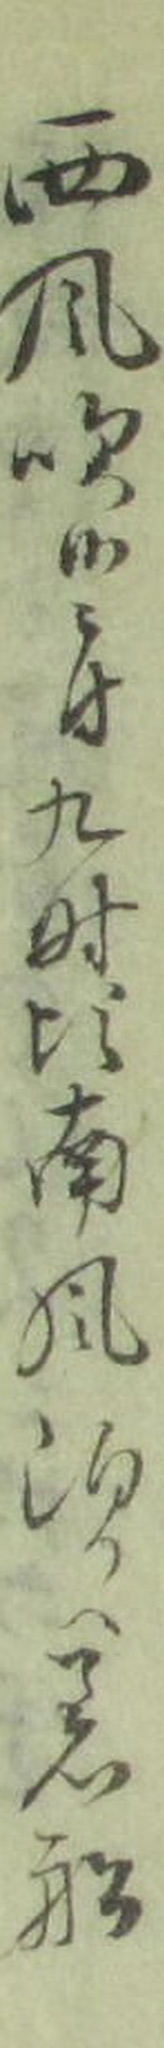西風吹候に付九時頃南風泊りへ着船
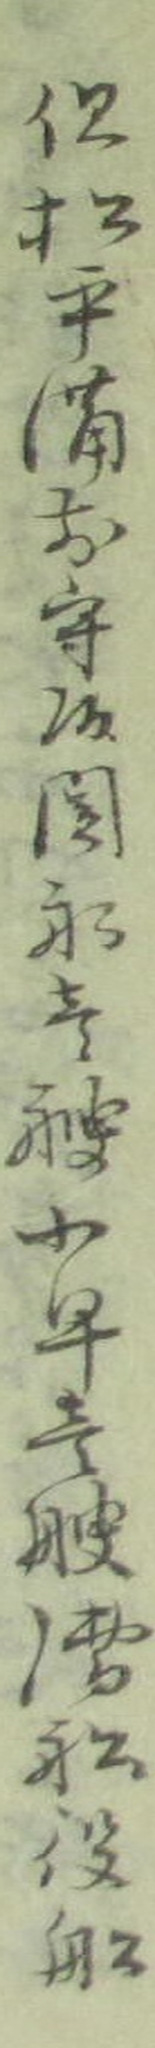但松平備前守殿関船壱艘小早壱艘漕船役船
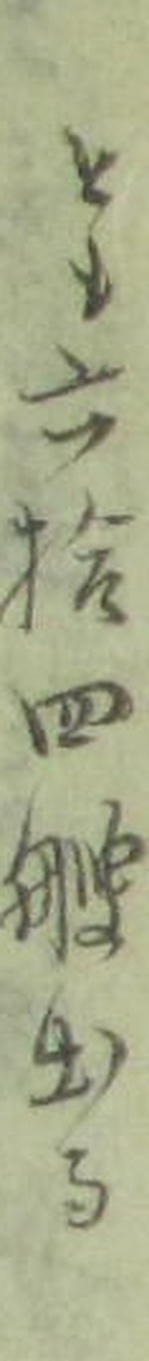とも六拾四艘出る
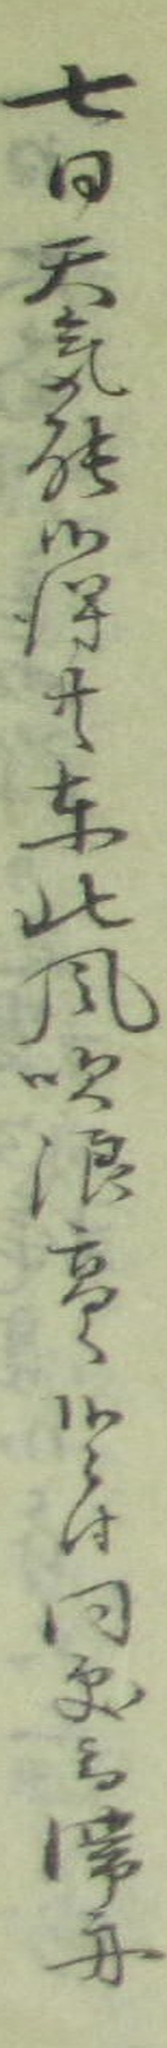七日天気能候得共東北風吹浪高く候に付同処に而滞舟

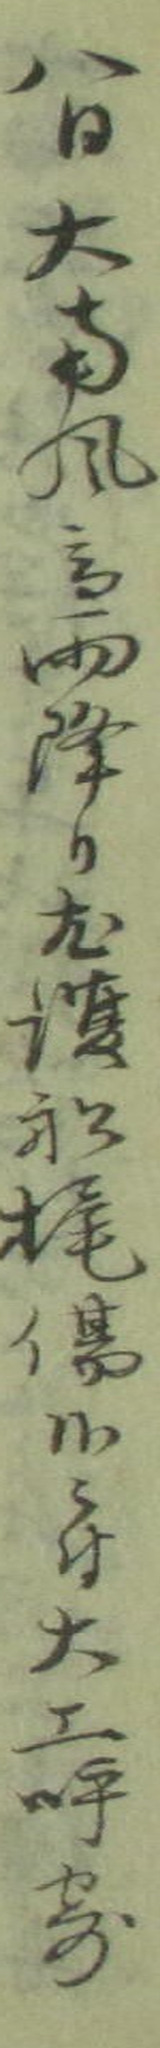八日大南風に而雨降り尤護船梶傷候に付大工呼寄
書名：紀州九木浦庄屋記録 四
